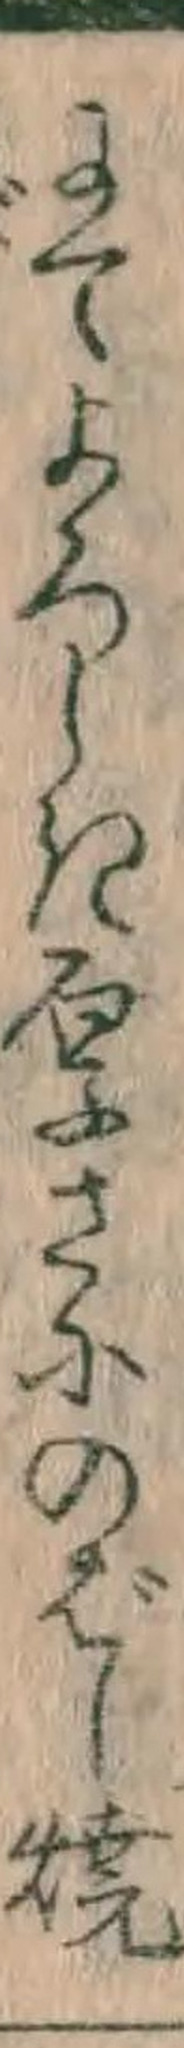にてよろしき厚さにのばし焼
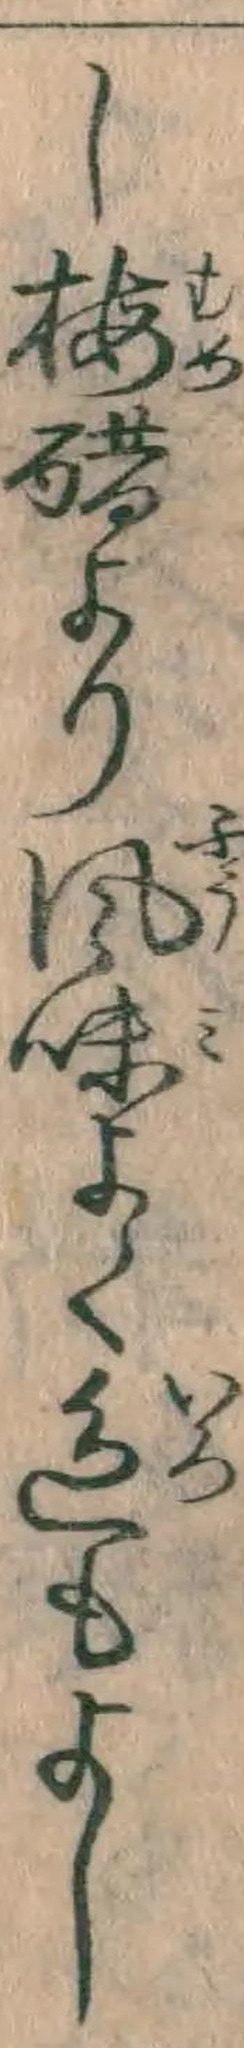し梅醋より風味よく色もよし
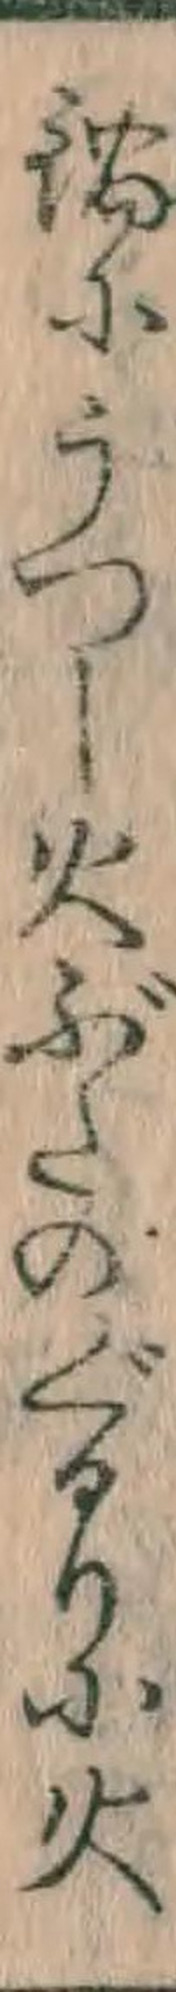鍋にうつし火ぶたのぐるりに火
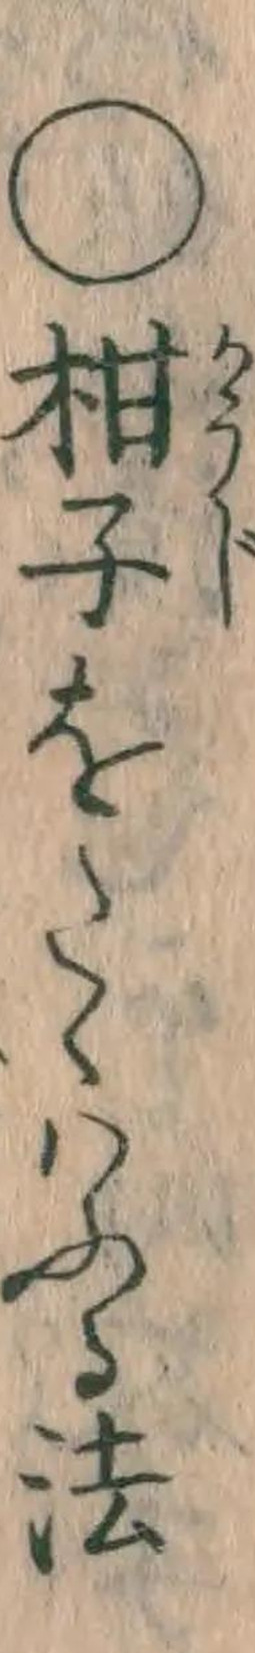○柑子をたくはふる法
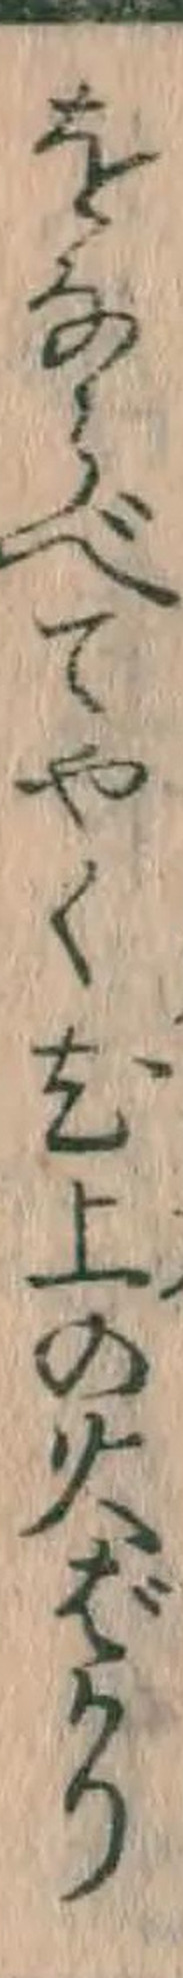をならべてやく尤上の火ばかり
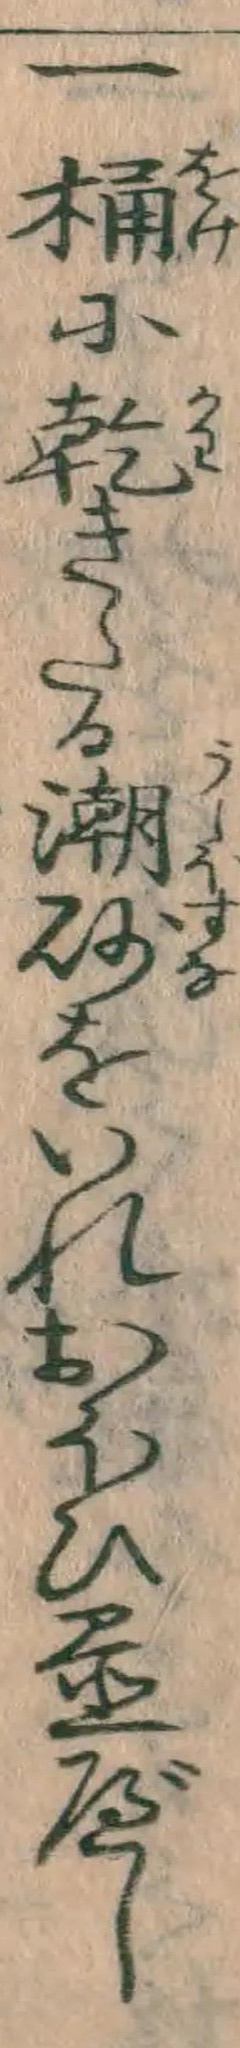一桶に乾きたる潮砂をいれおほひ置べし
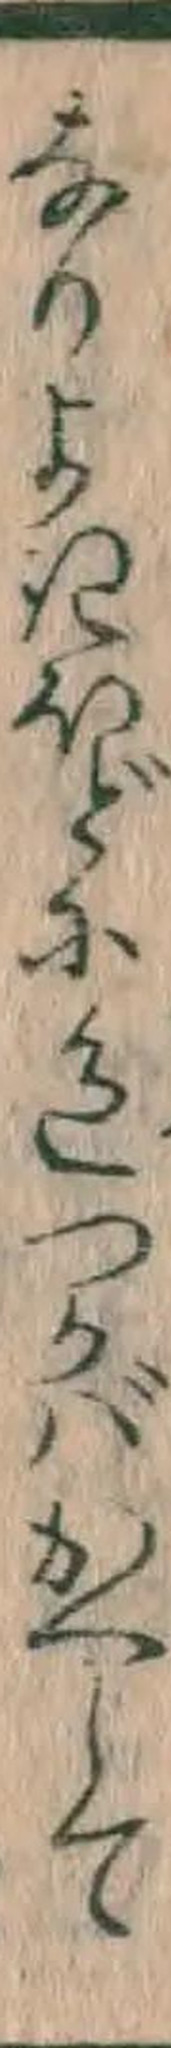なりよきほどに色つかばかへして
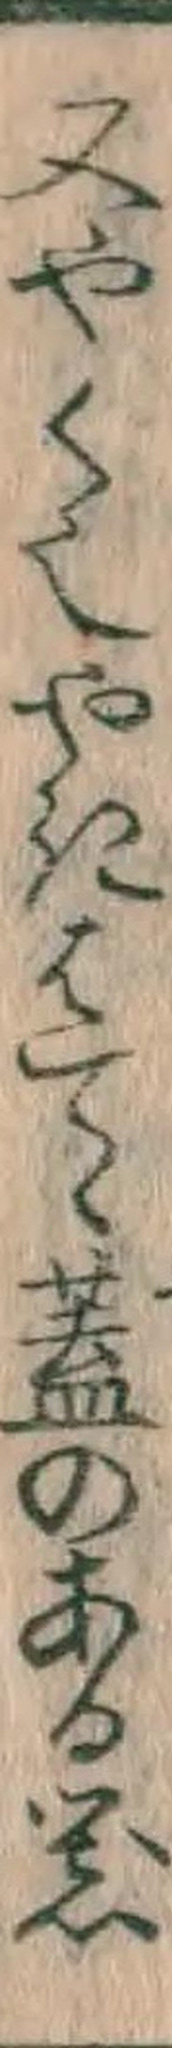又やく也やきはてゝ蓋のある器
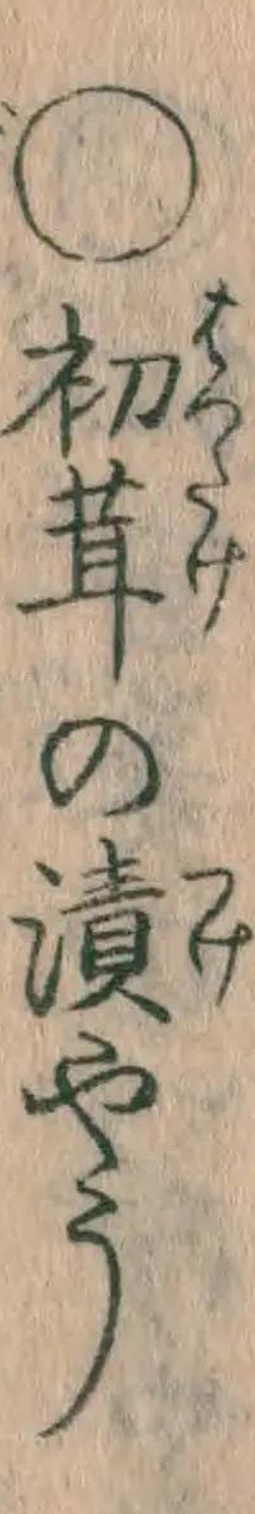○初茸の漬やう
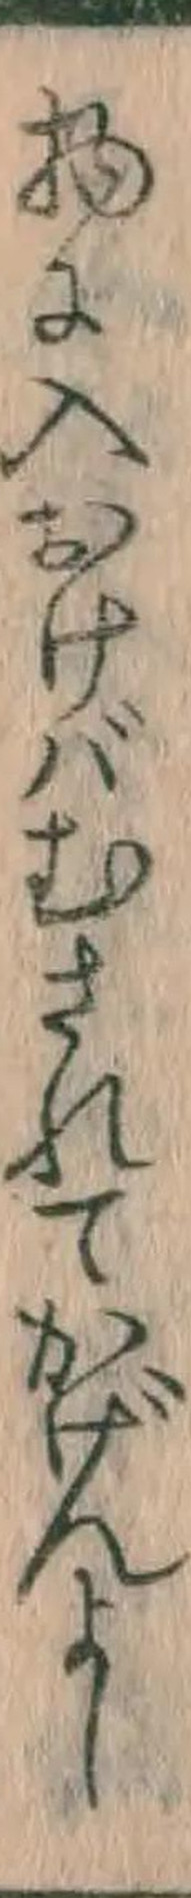物に入おけばむされてかげんよし
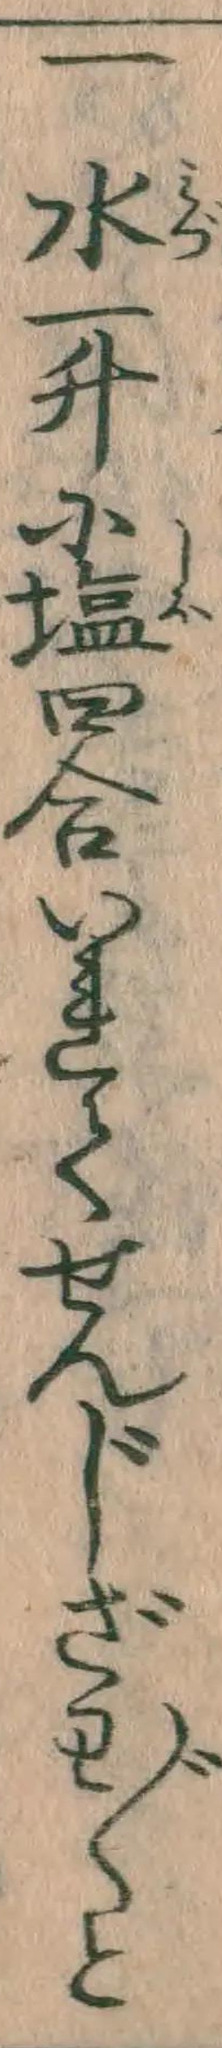一水一升に塩四合いれてせんじざわ〴〵と
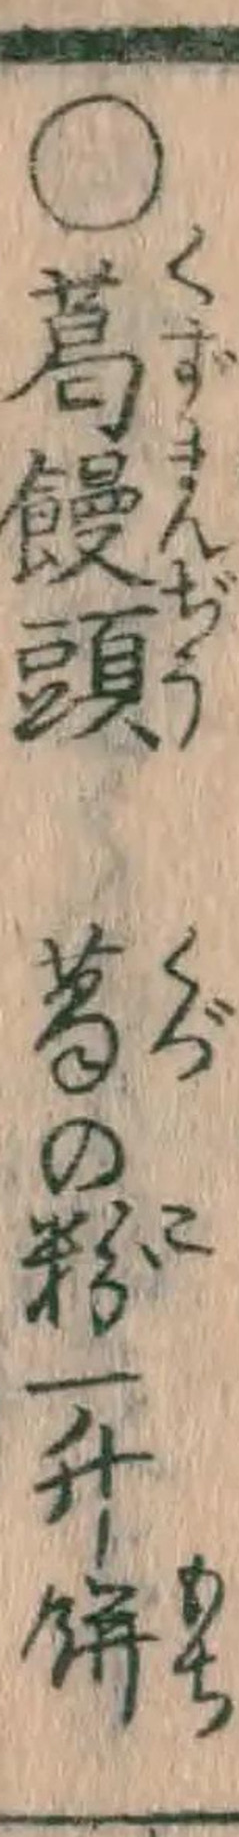○葛饅頭葛の粉一升餅
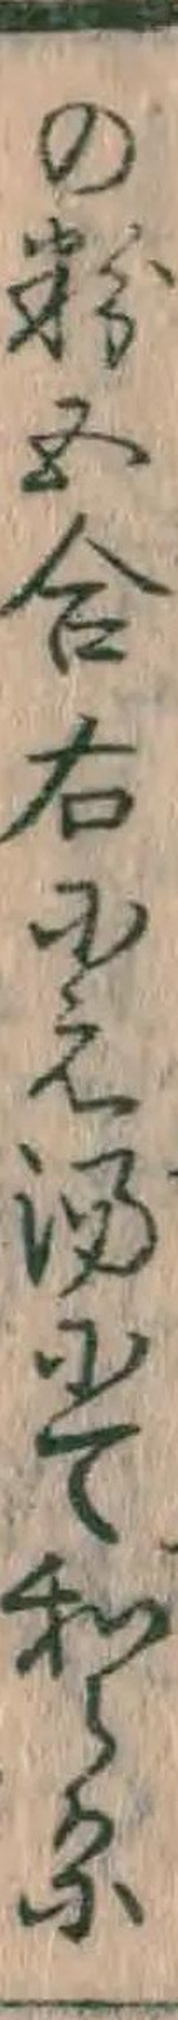の粉五合右にえ湯にて和らかに
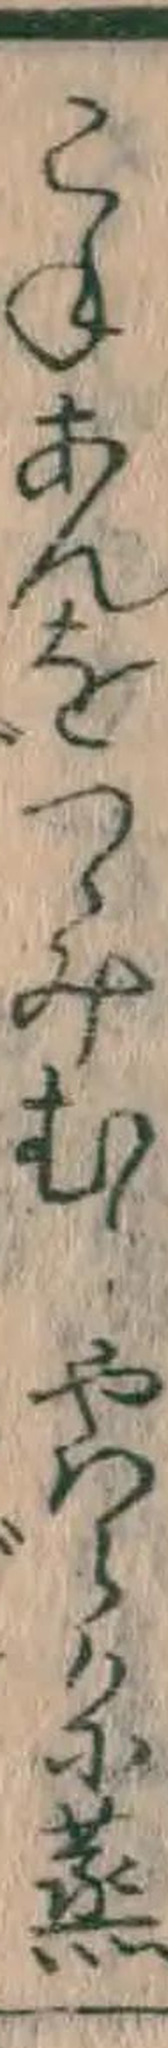こねあんをつゝみむしやはらかに蒸
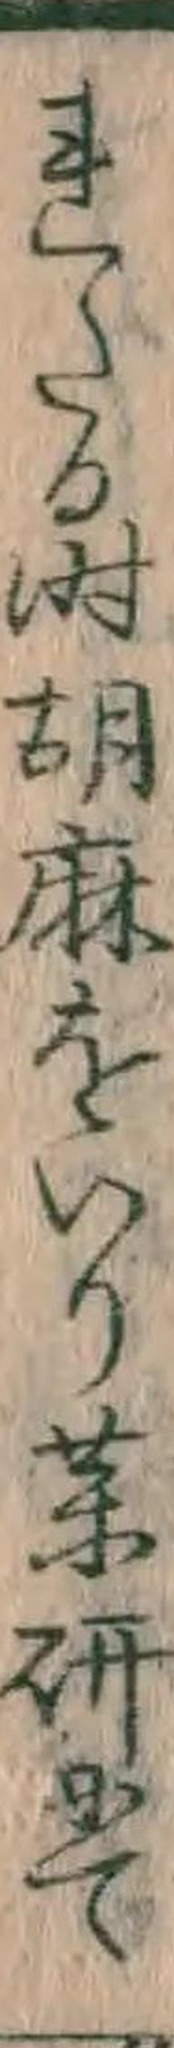れたる時胡麻をいり薬研にて
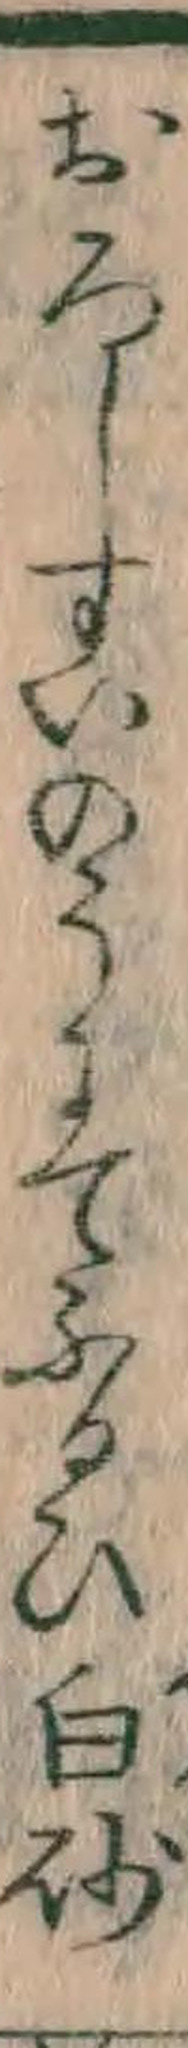おろしすいのうにてふるひ白砂
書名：広益秘事大全 3巻. [5]
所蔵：国立国会図書館 National Diet Library, JAPAN
